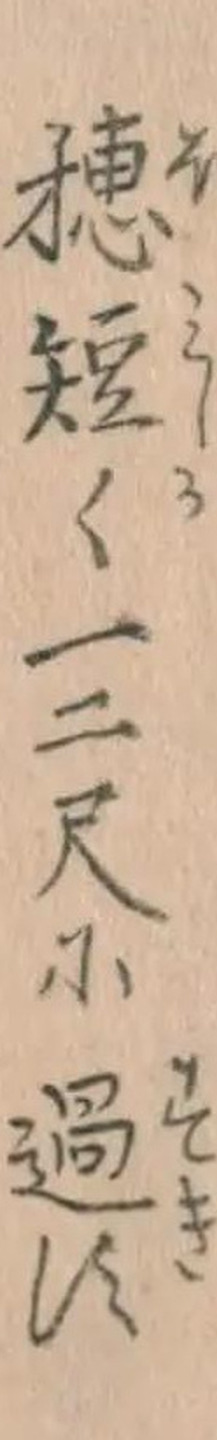穂短く一二尺に過す
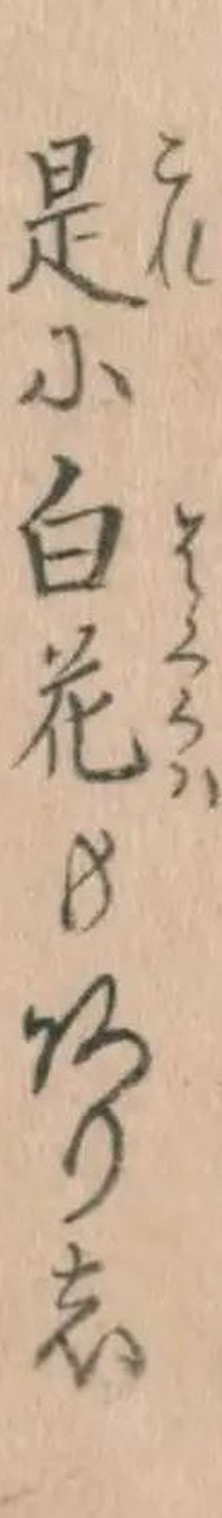是に白花もありし
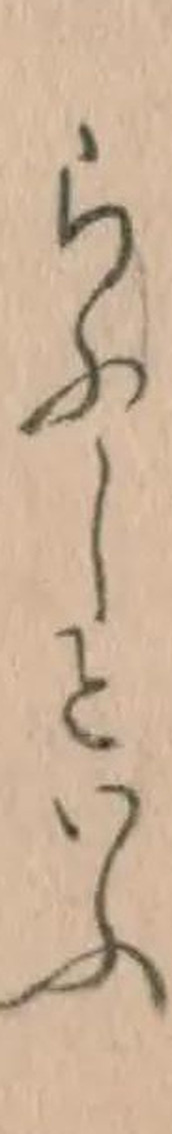らふしといふ

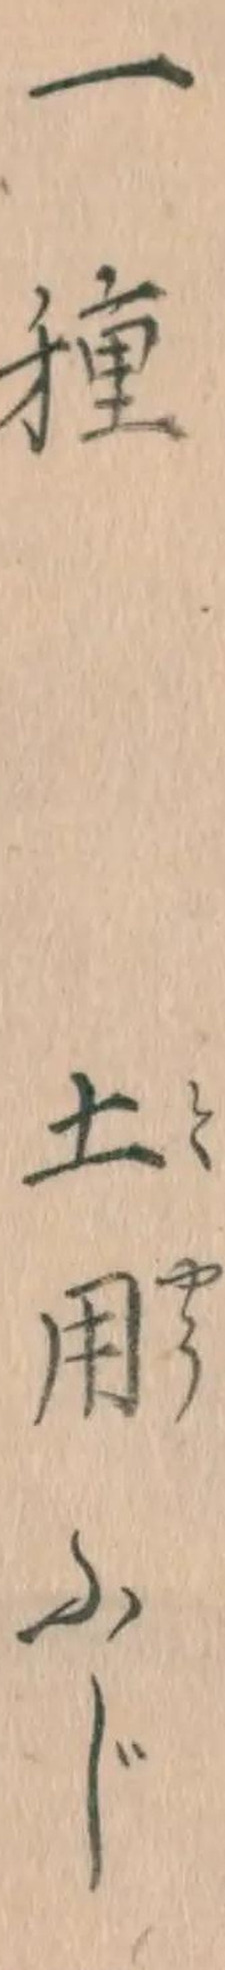一種土用ふじ
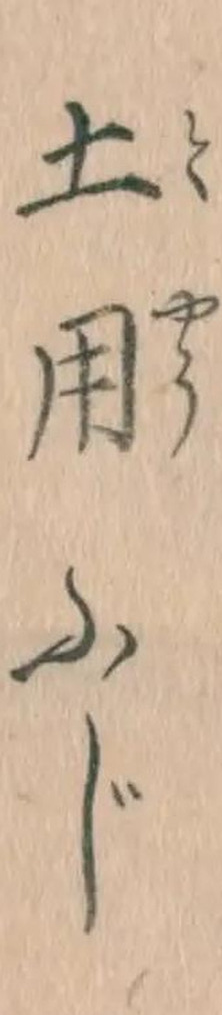土用ふじ
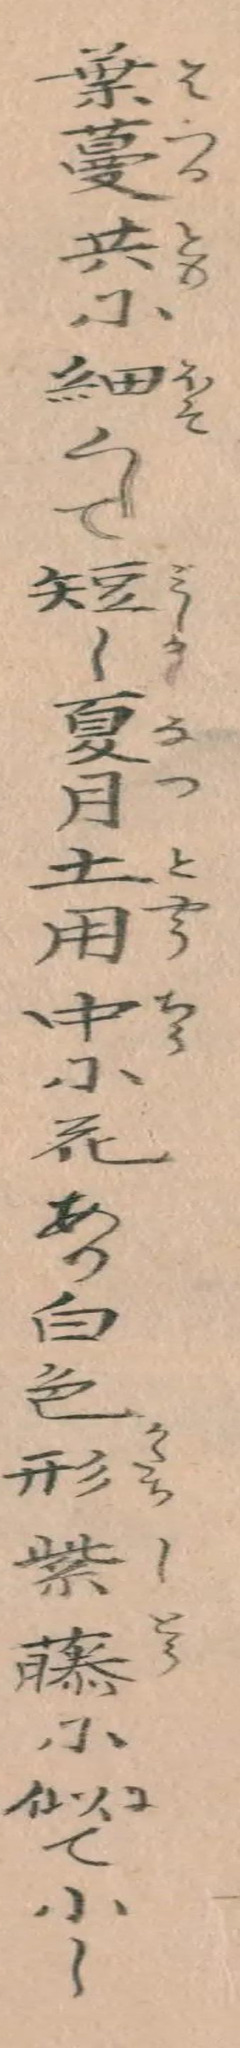葉蔓共に細くして短し夏月土用中に花あり白色形紫藤に似て小し
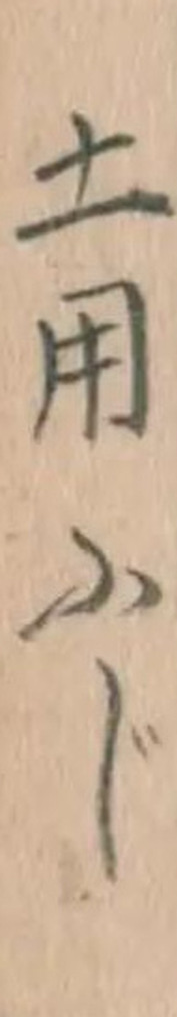土用ふじ

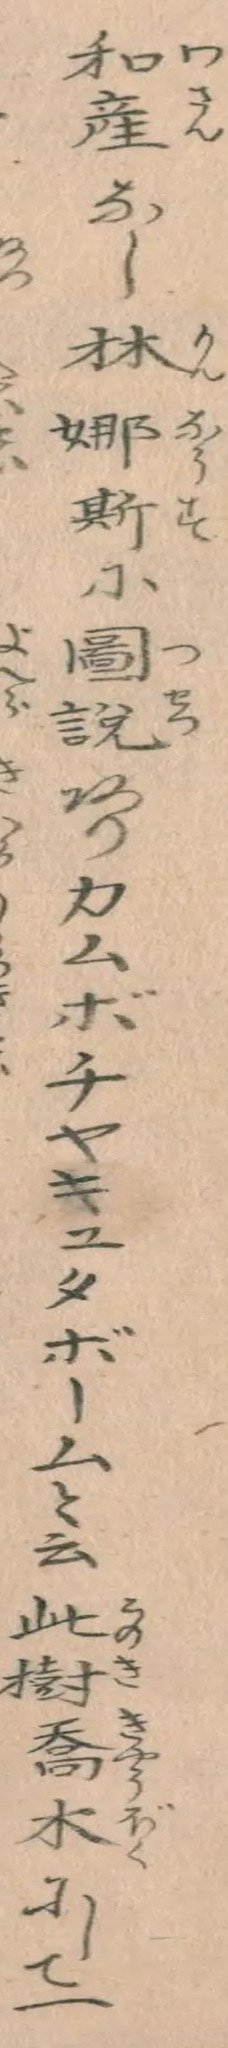和産なし林娜斯に図説ありカムボチヤキユタボームと云此樹喬木にして一
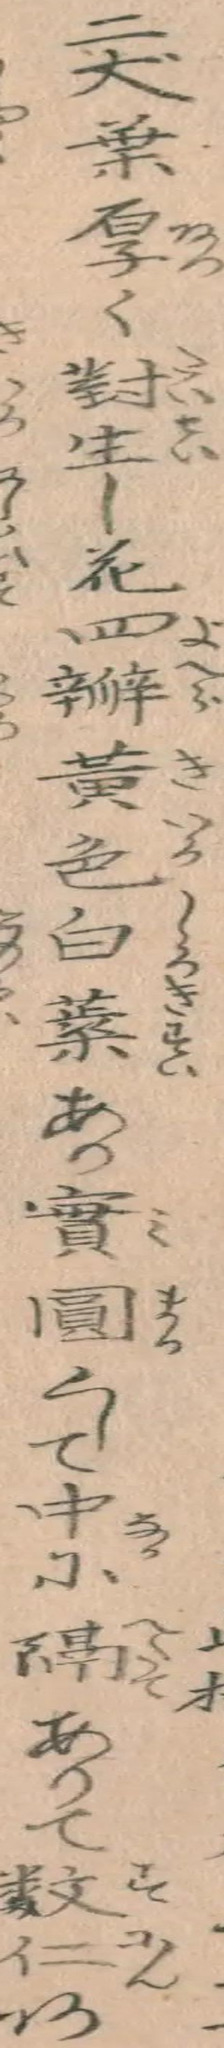二丈葉厚く対生し花四弁黄色白蕊あり実円くして中に隔ありて数仁あ
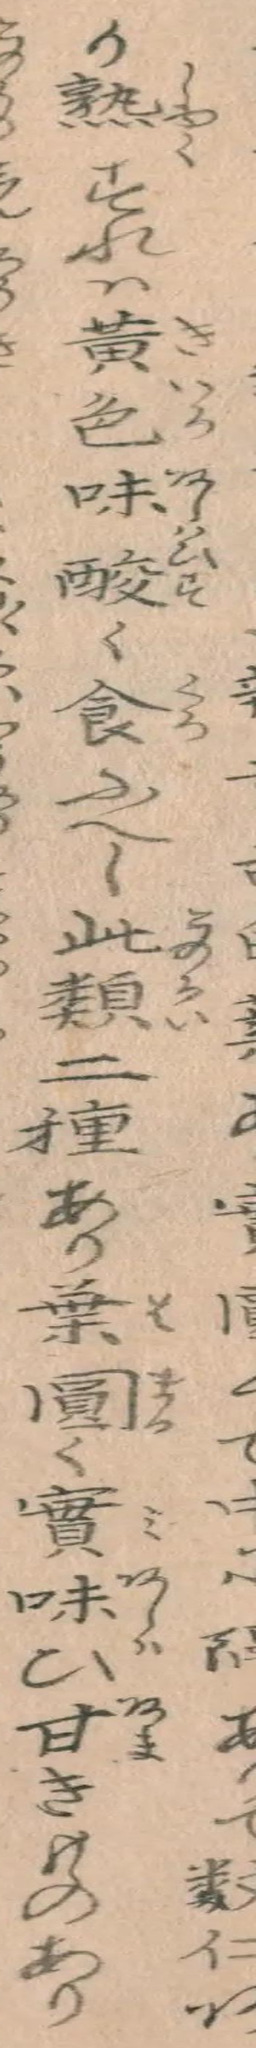り熟すれは黄色味酸く食ふへし此類二種あり葉円く実味ひ甘きものあり
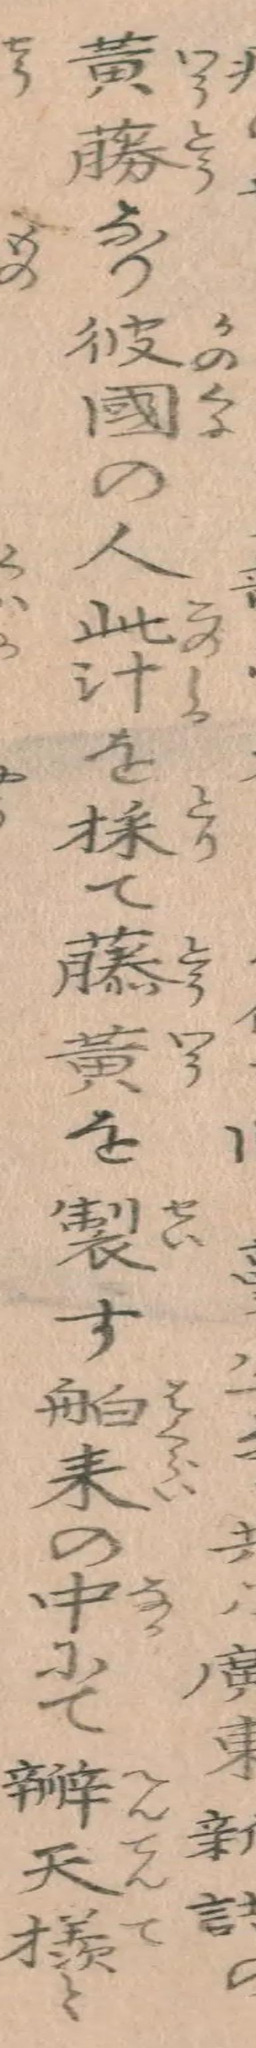黄藤なり彼国の人此汁を採て藤黄を製す舶来の中にて弁天檨と
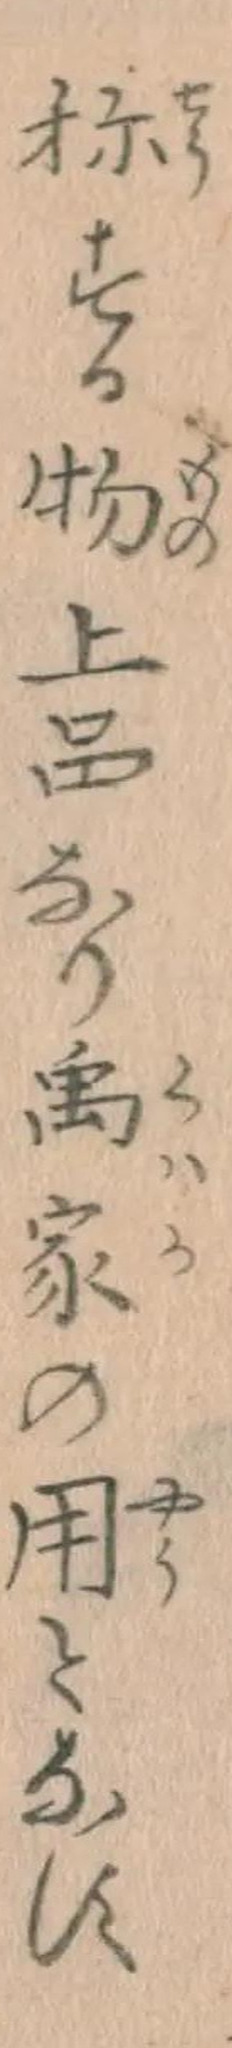称する物上品なり禹家の用となす

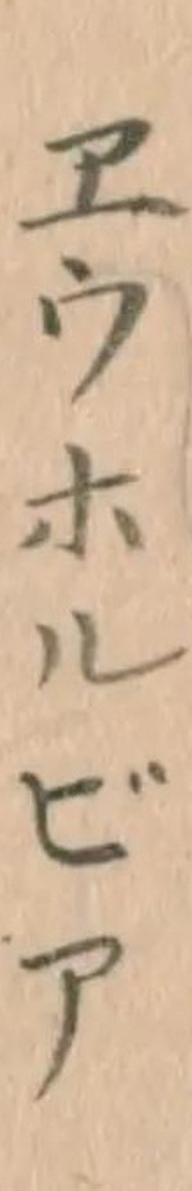ヱウホルビア
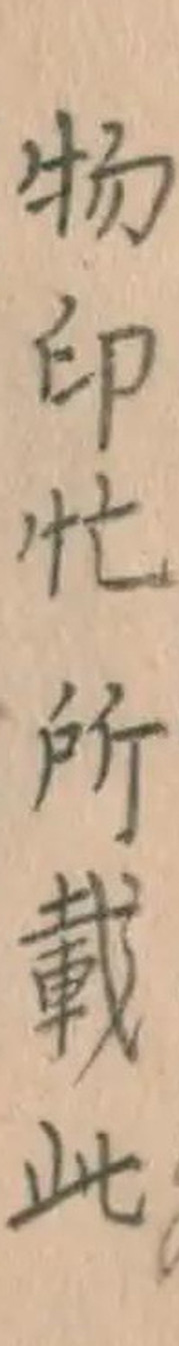物印忙所載此
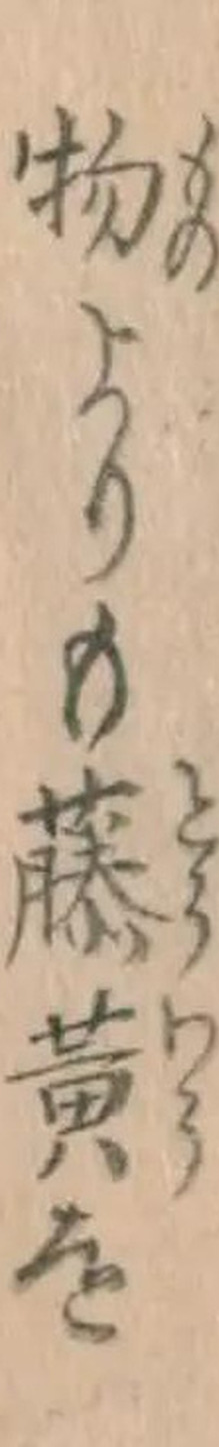物よりも藤黄を

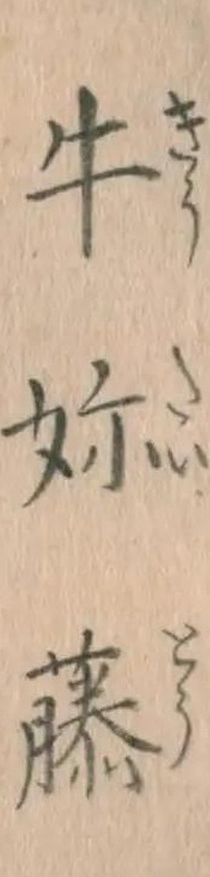牛嬭藤
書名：本草図譜. 巻31-33
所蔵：国立国会図書館 National Diet Library, JAPAN
